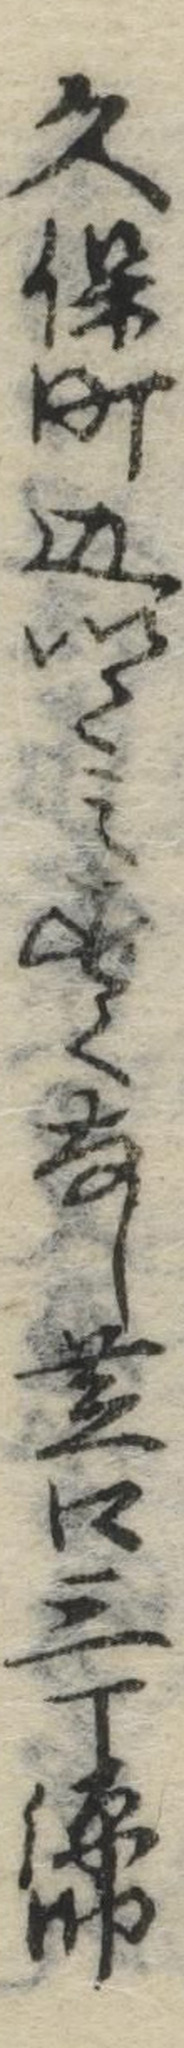久保町辺いたみすくなし芝口三町源助
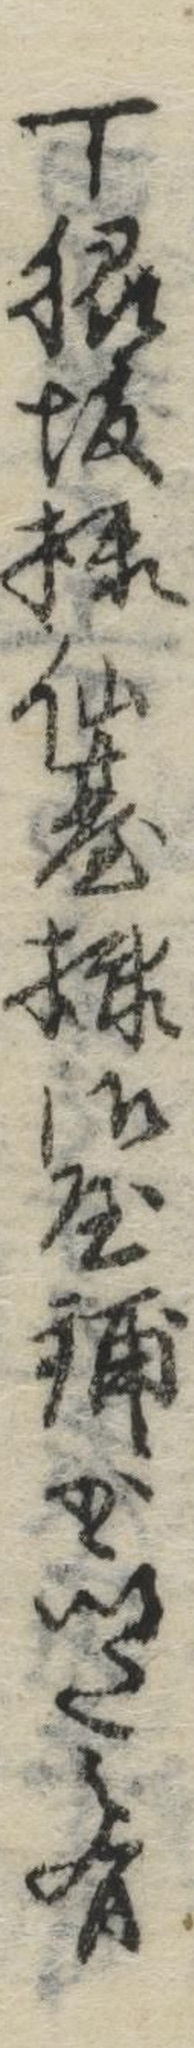丁脇坂様仙台様御屋鋪少々いたミ有
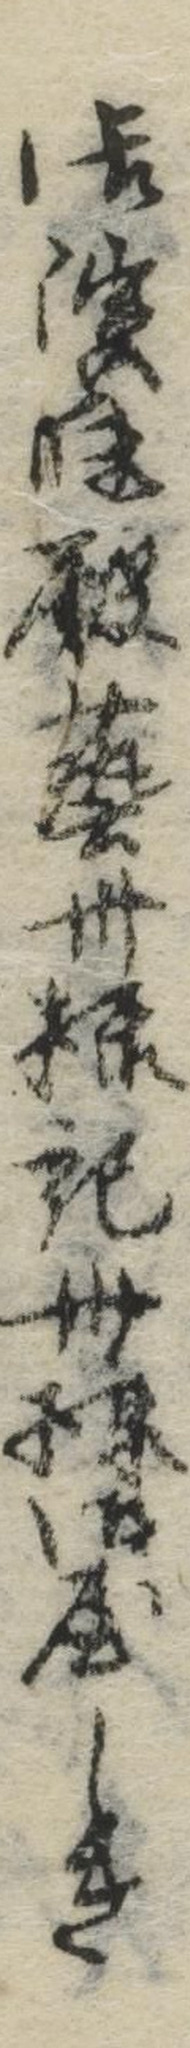御浜御殿芸州様紀州様御屋しき
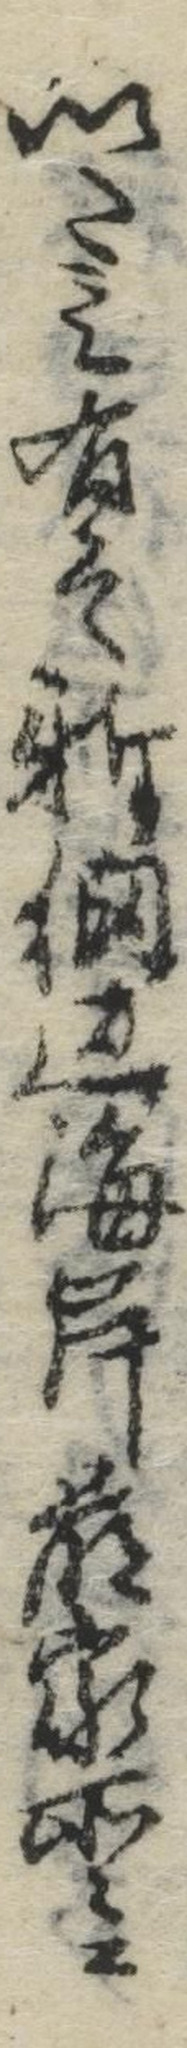いたミ有之新佃辺海岸崩家所々二
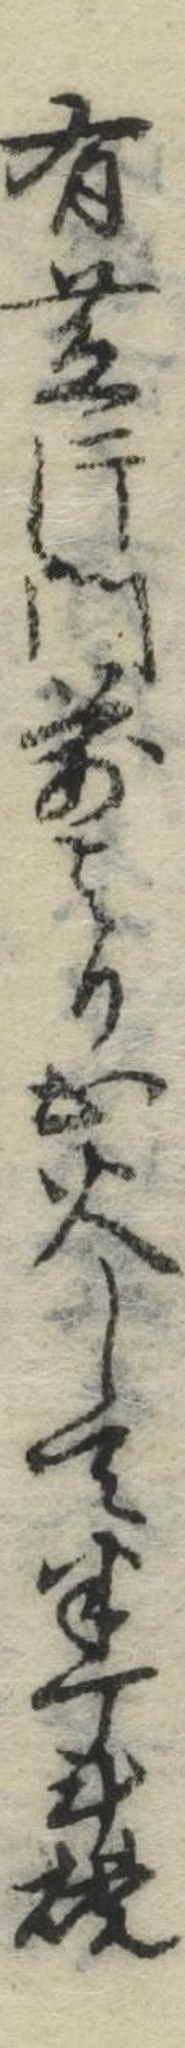有芝片門前より出火して半丁斗焼
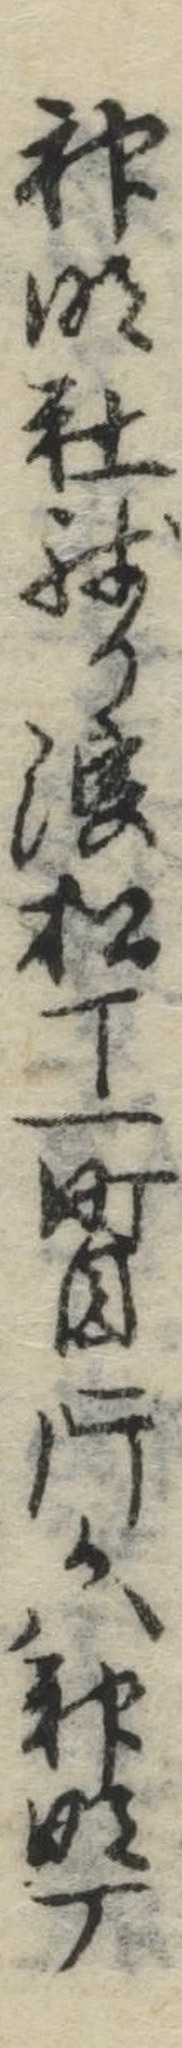神明社残り浜松丁一町目方かハ神明丁
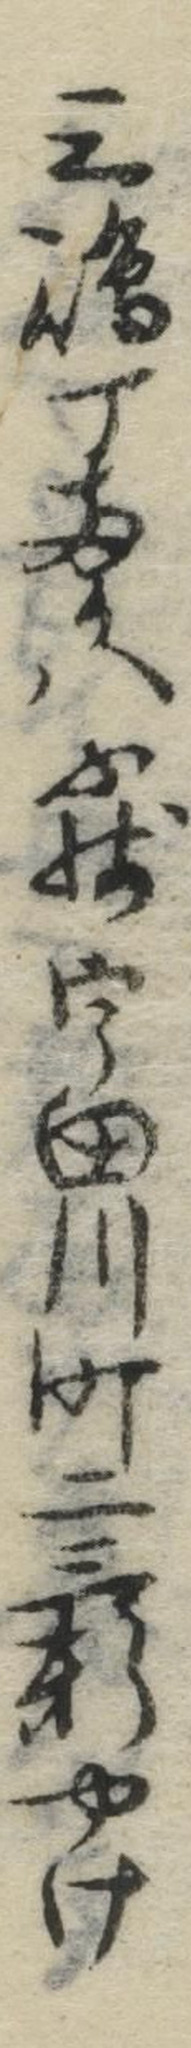三嶋丁両かハ不残宇田川町二三軒やけ
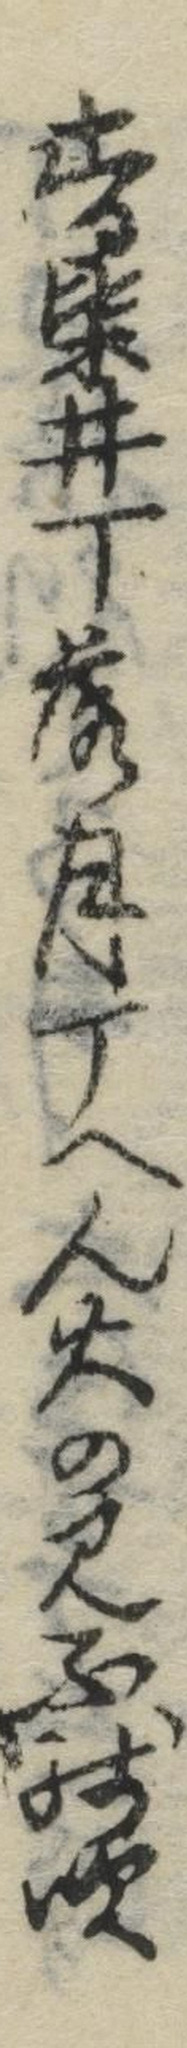す柴井丁露月丁へん火の見不残吹
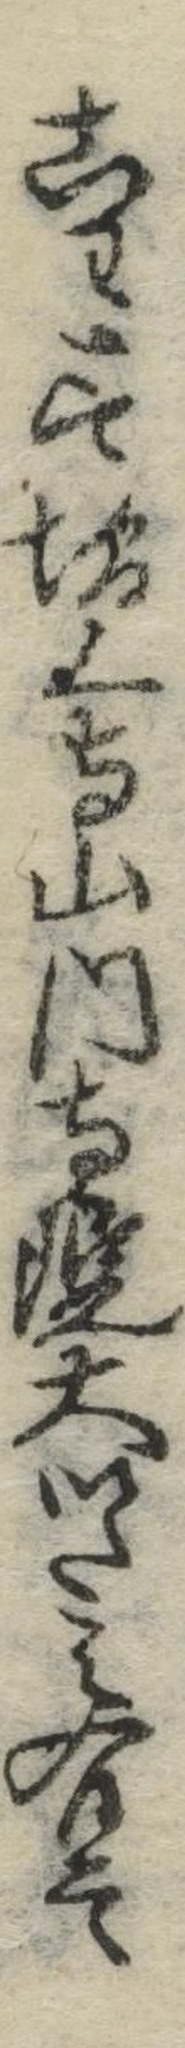こわす増上寺山門寺院大いたミ有之
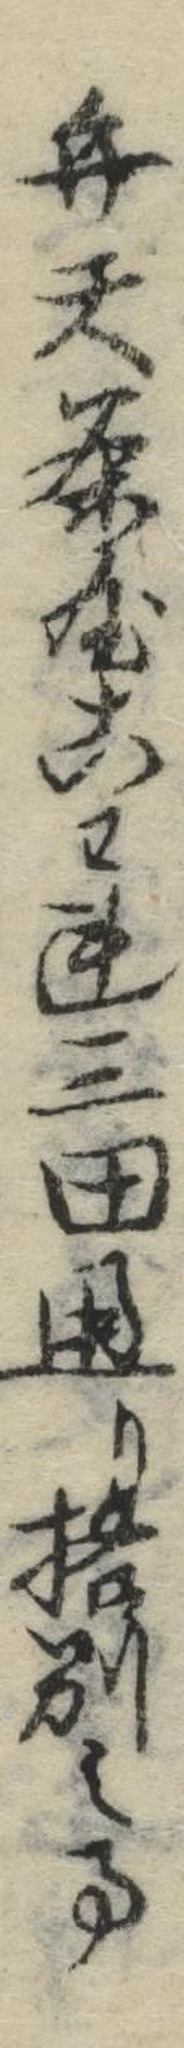弁天茶屋こわれ三田通り格別之事
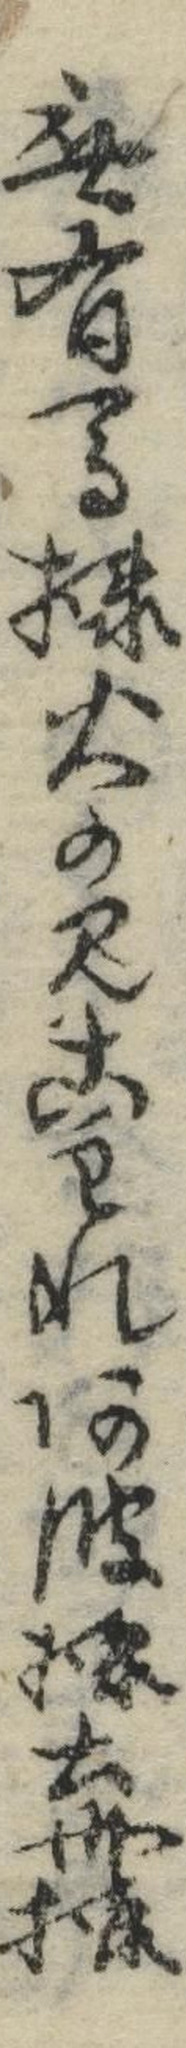無有馬様火の見こわれ阿波様土州様
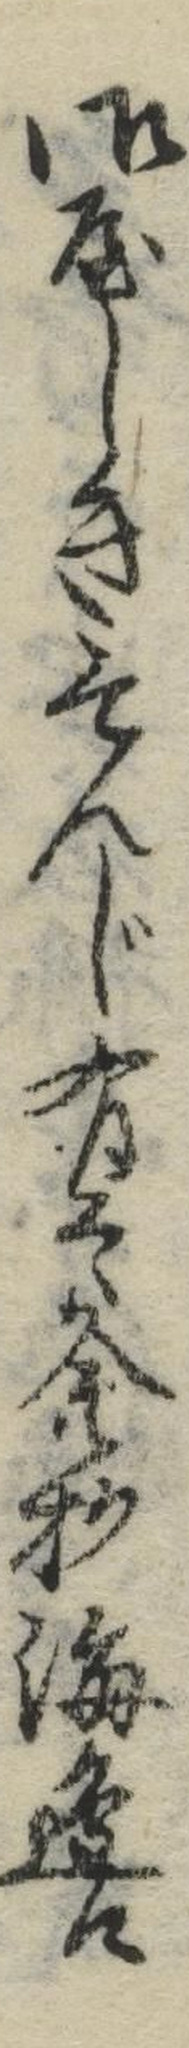御屋しきそんじ有之金杉海辺江
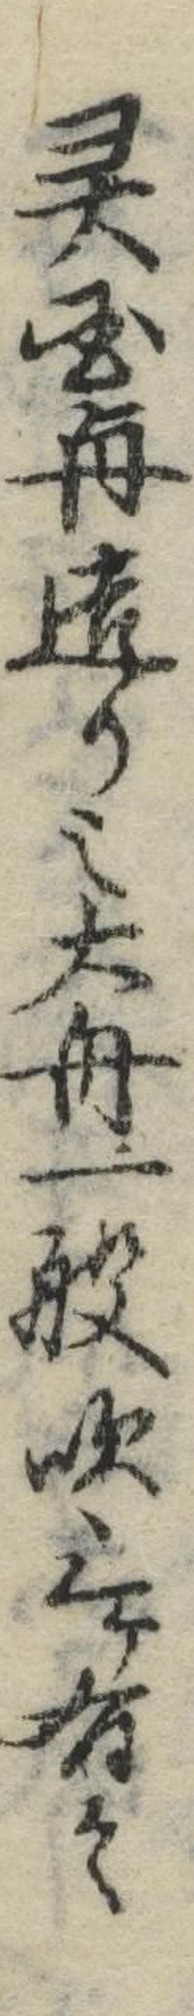異国舟遣り之大舟一艘吹上ヶ有之
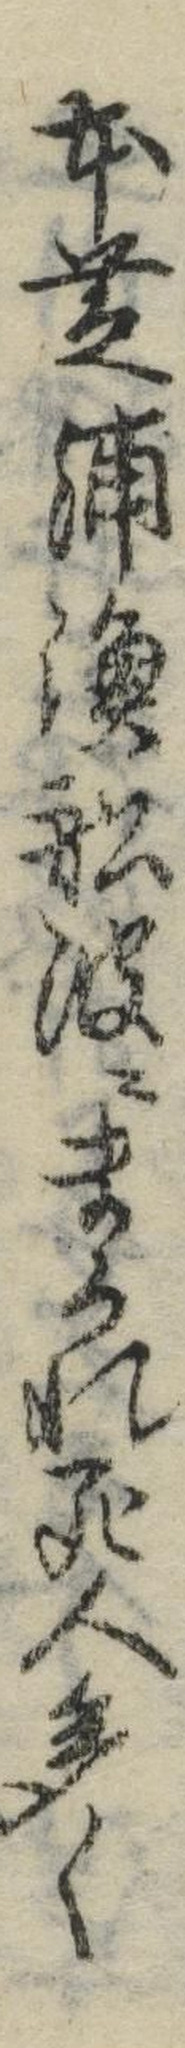本芝浦漁船波二まかれ死人多く
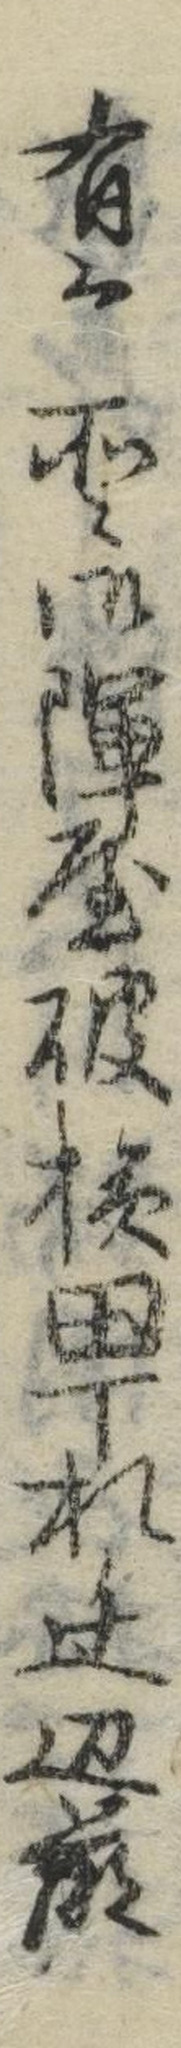有之所々御陣屋破損損田丁札辻辺崩
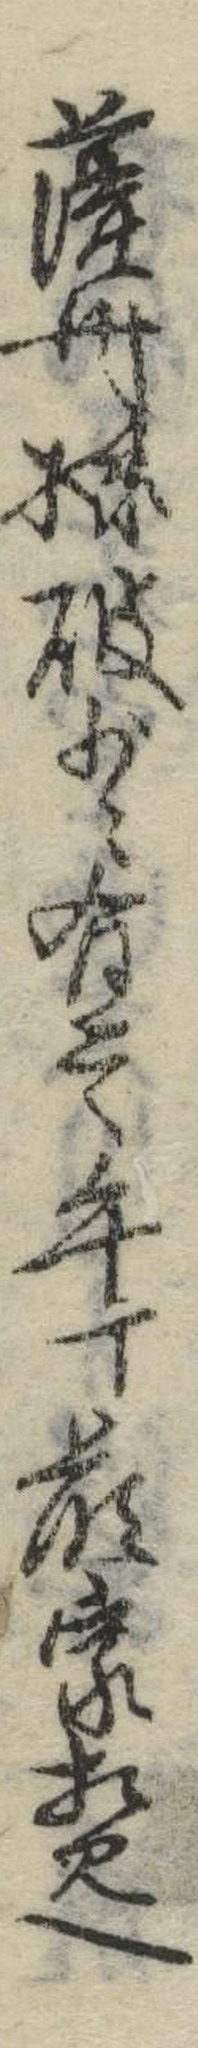薩州様破少々有之午丁崩家相見へ
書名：安政三年辰八月廿五日夜　大江都御屋敷方寺社市中共　大嵐水入場所明細書之寫　并街道筋近郷聞書
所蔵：東京大学地震研究所図書室 Earthquake Research Institute Library, The University of Tokyo, JAPAN
